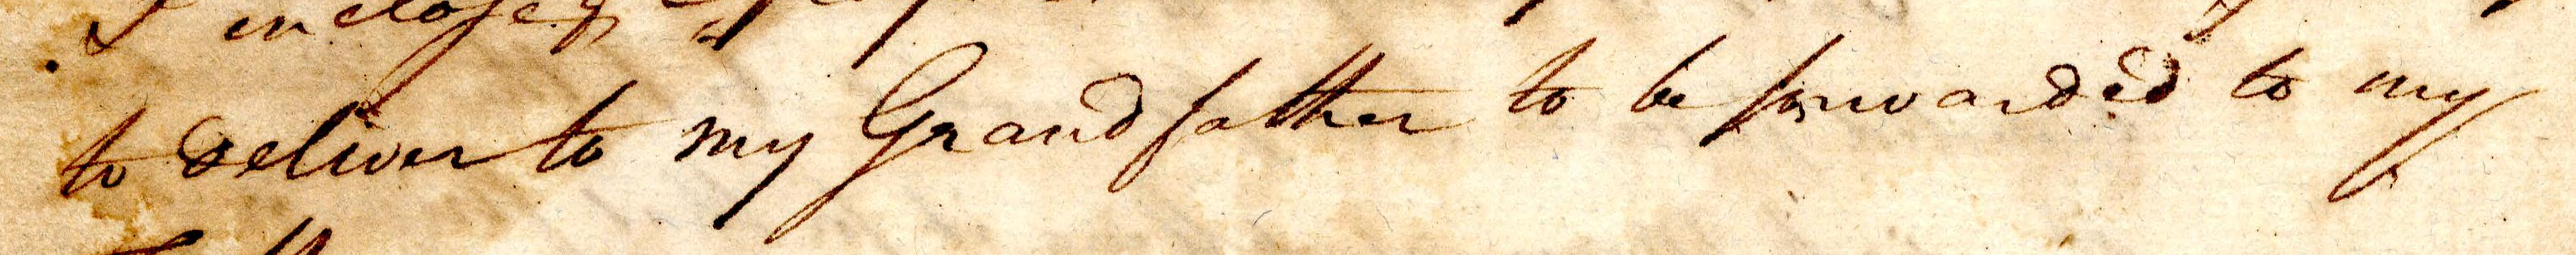to deliver to my Grandfather to be forwarded to my
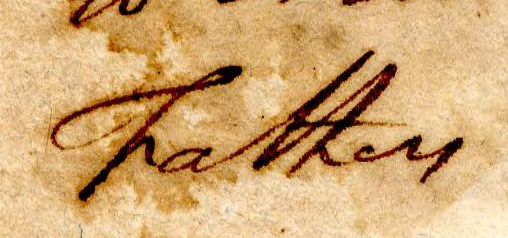Fathers.
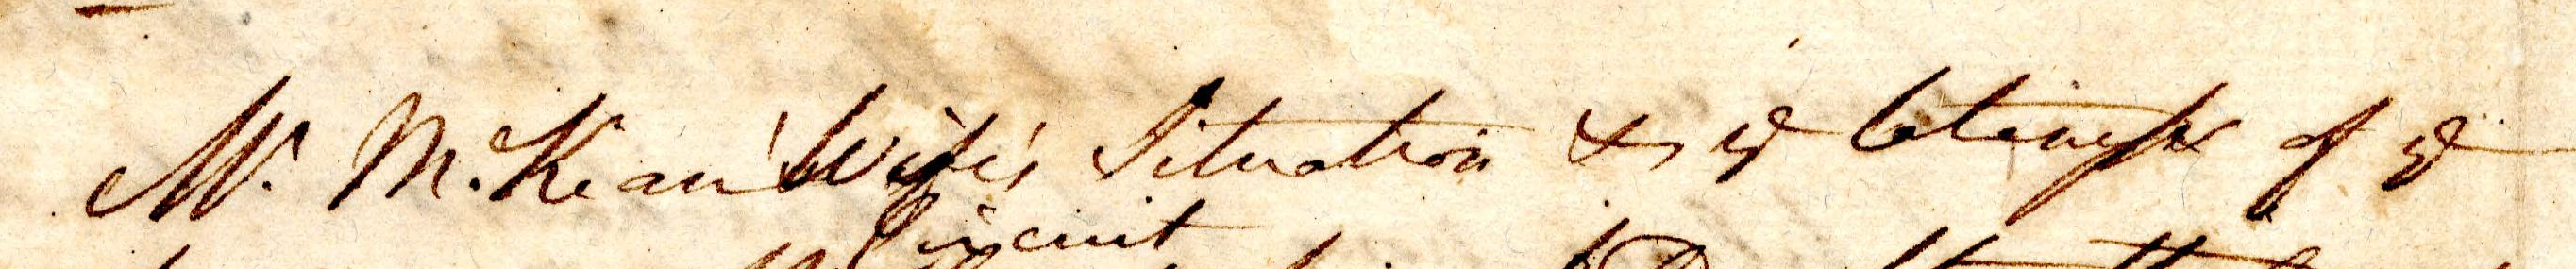M^r. M^cKean's Wife's Situation & y^e leteacsses of y^e
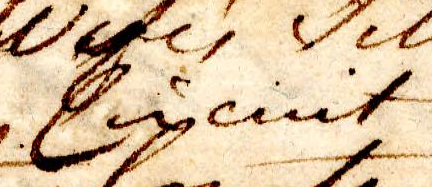Circuit
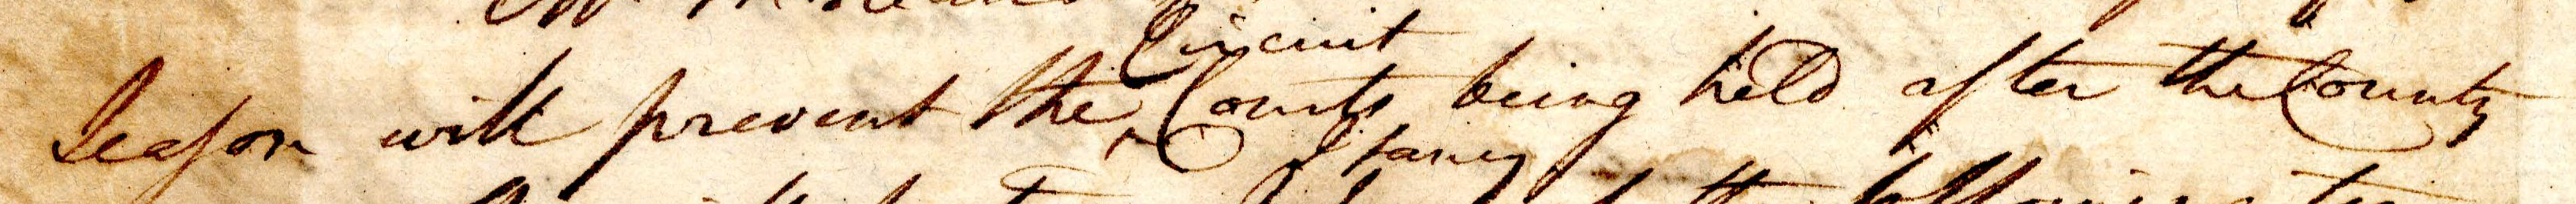Season will prevent the ^ Courts being held after the County
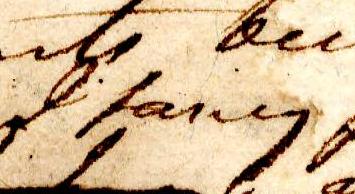I fancy
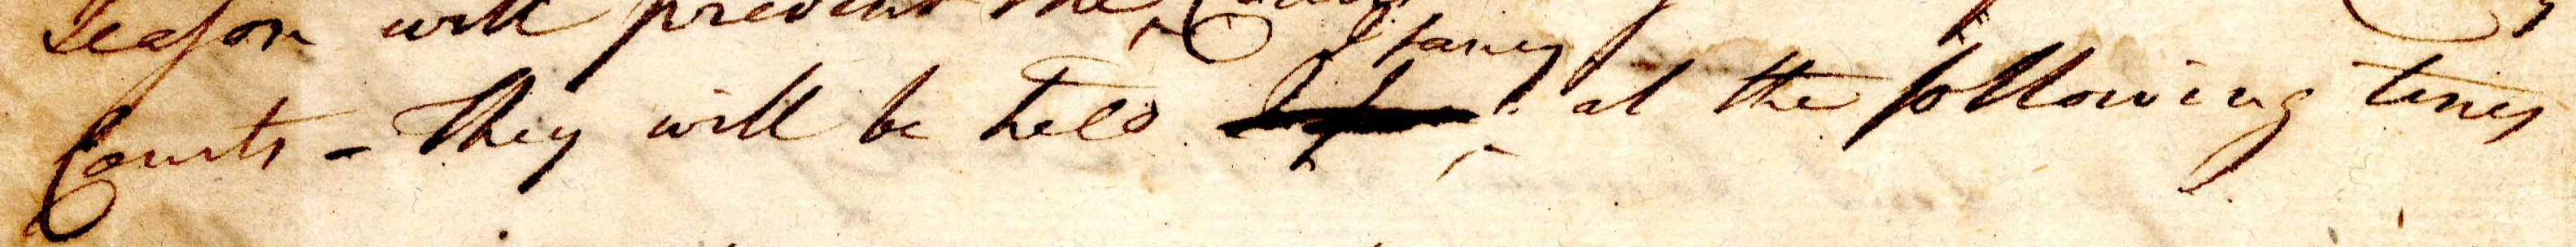Courts. They will be held ^ at the following times
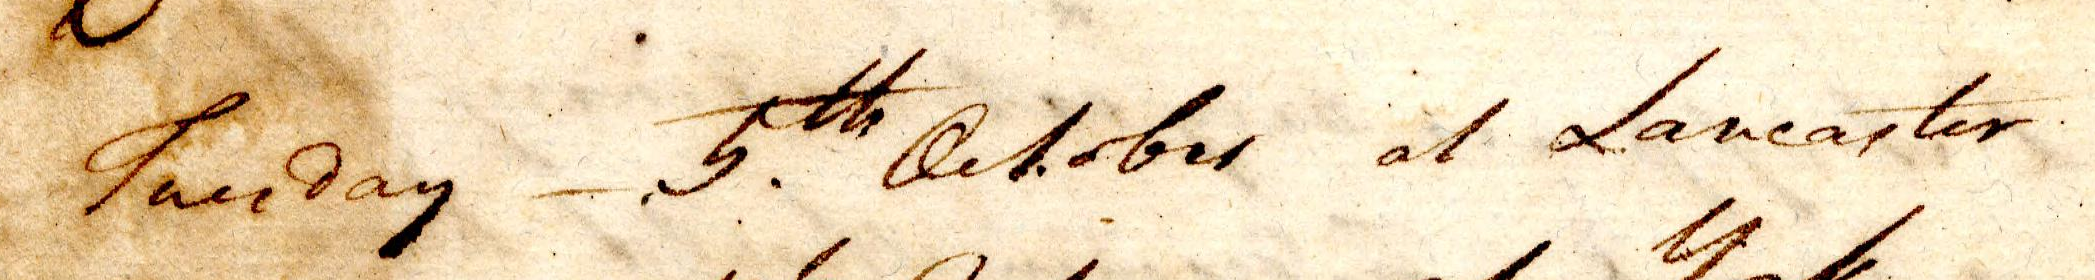Tuesday. 5^th. October at Lancaster
